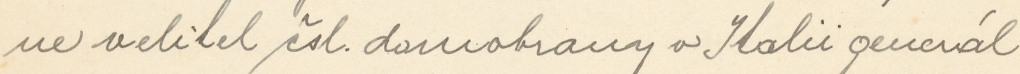ne velitel čsl. domobrany v Italii generál
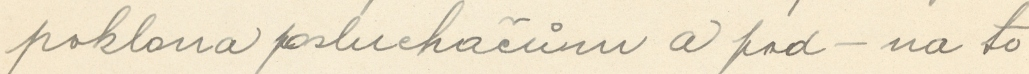poklona posluchačům a pod- na to
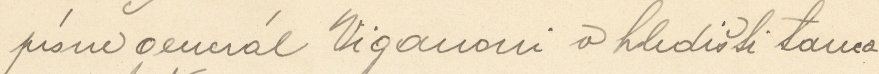písně generál Viganoni v hledišti tanco-
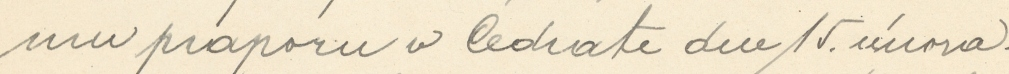mu praporu v Cedrate dne 15. února.
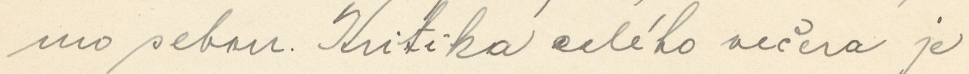mo sebou. Kritika celého večera je
